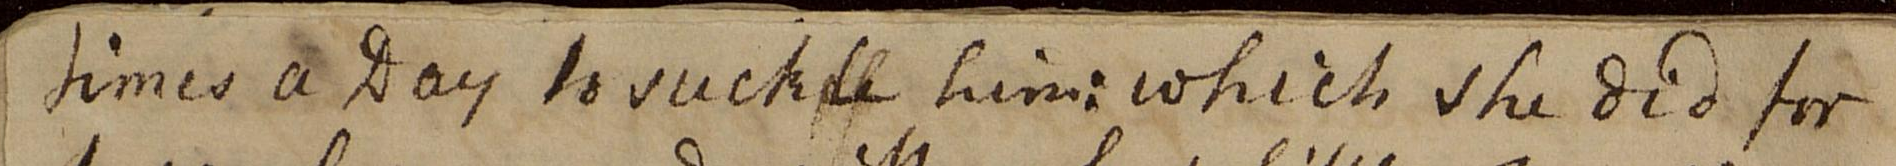times a Day to suckle him: which she did for
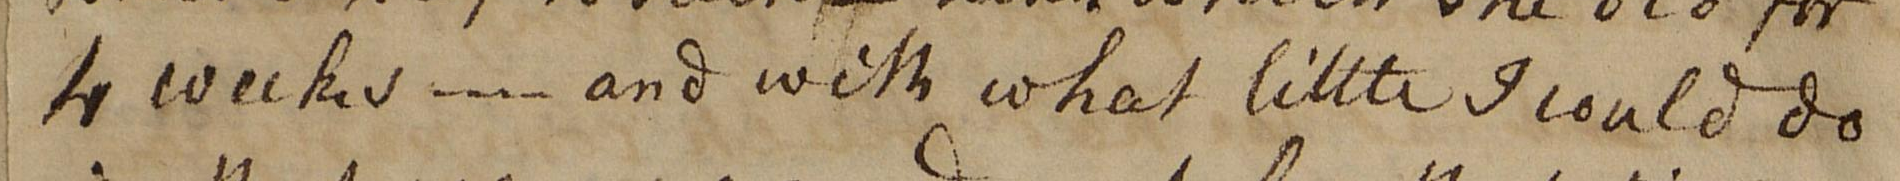4 weeks- and with what little I could do
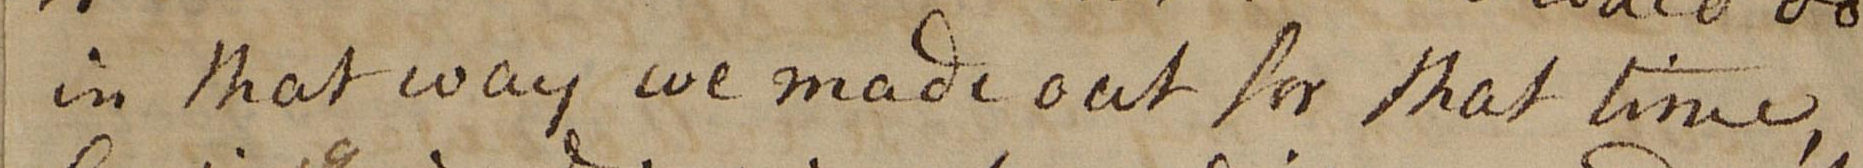in that way we made out for that time,
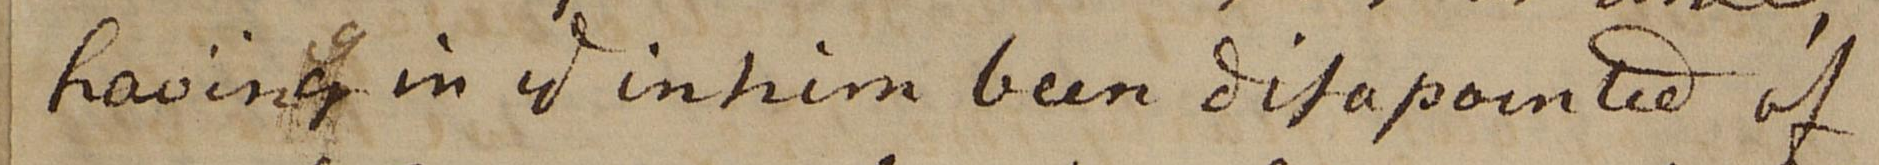having in y^e intrim been disapointed of
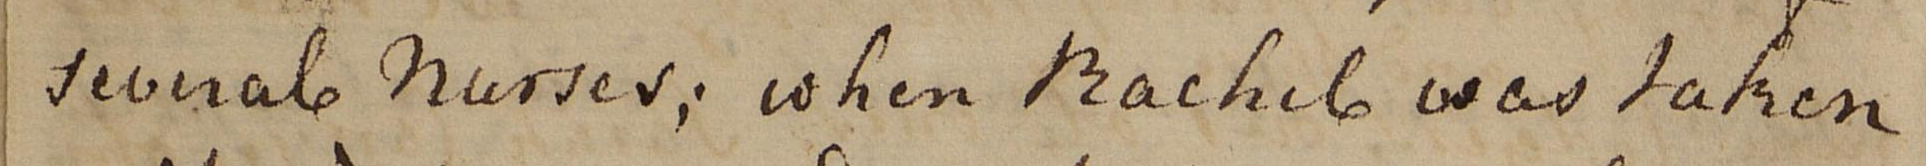several Nurses; when Rachel was taken
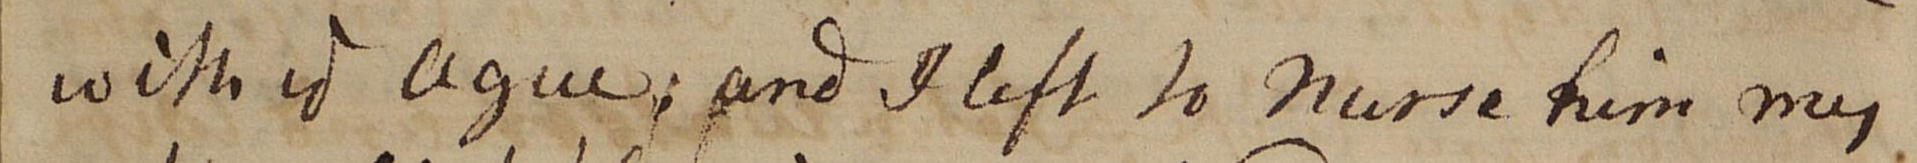with y^e Ague, and I left to Nurse him my
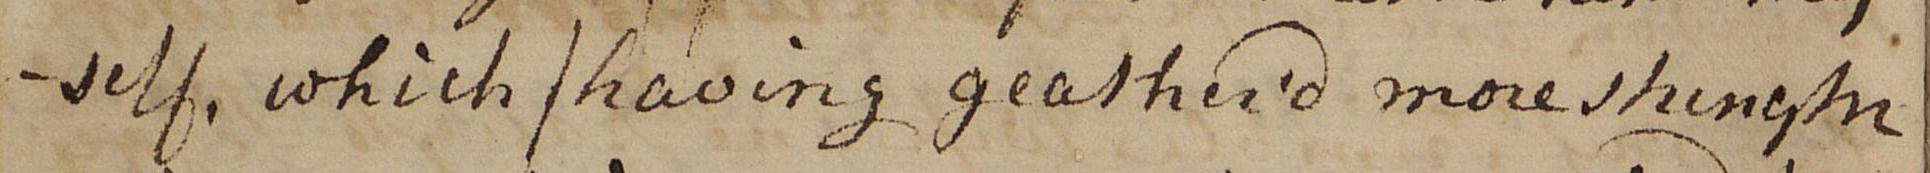-self, which /having geather'd more strength
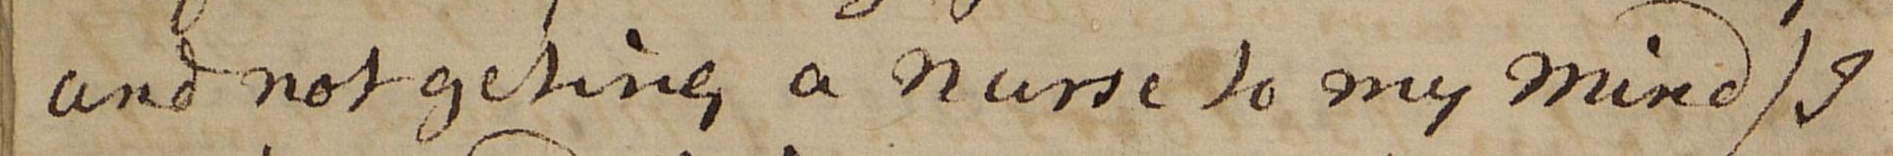and not geting a nurse to my mind/ I
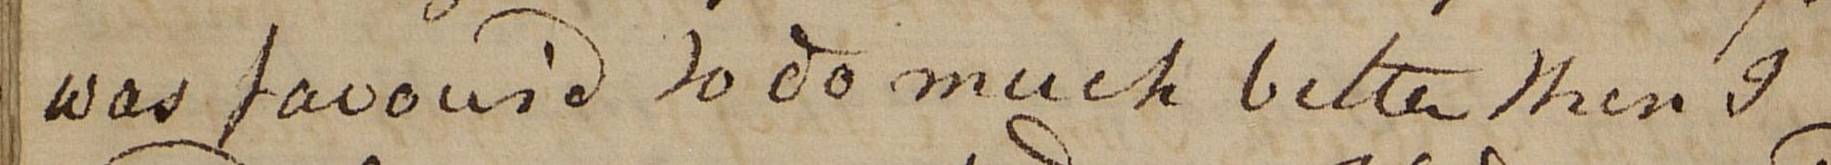was favour'd to do much better then I
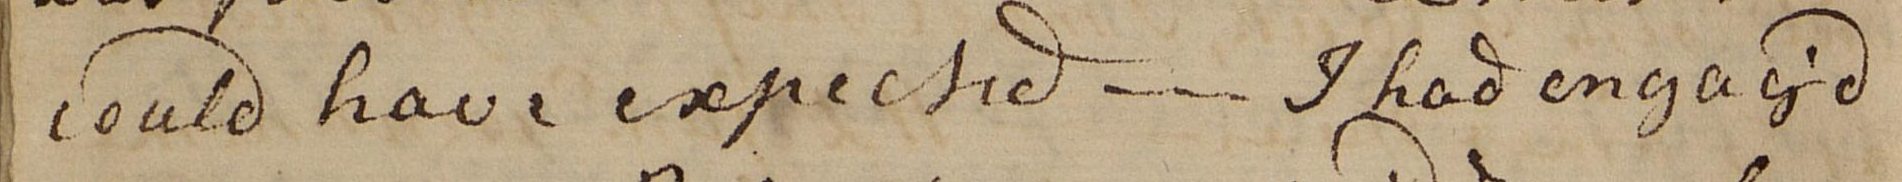could have expected-- I had engag'd
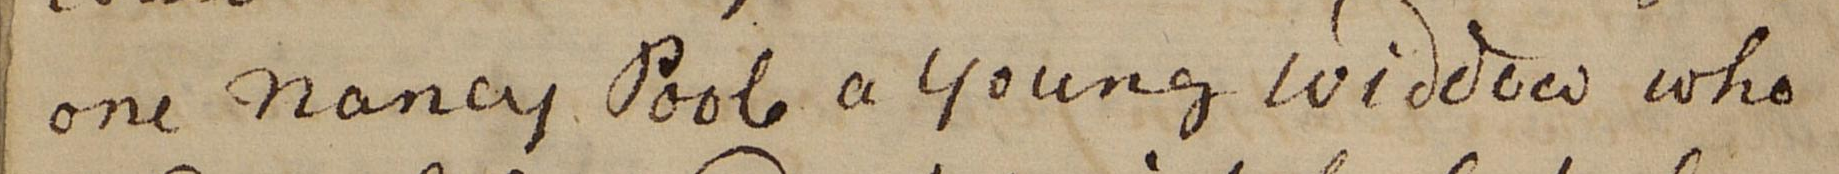one Nancy Pool a young widdow who
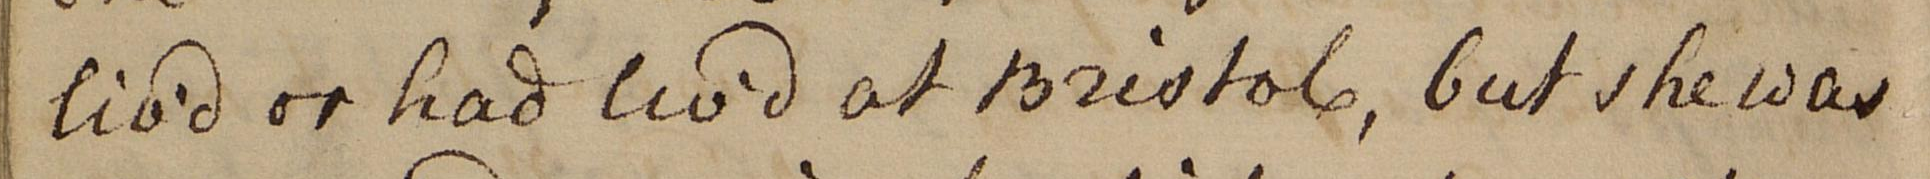liv'd or had liv'd at Bristol, but she was
